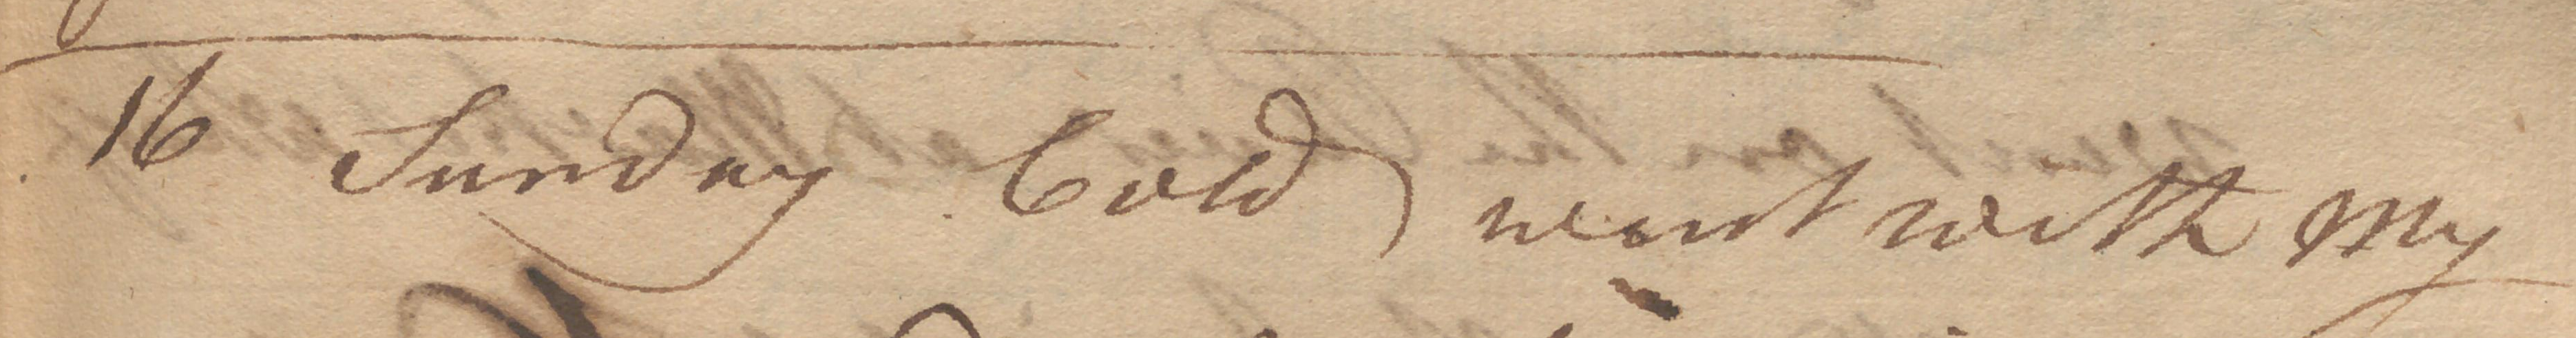16 Sunday Cold went with my
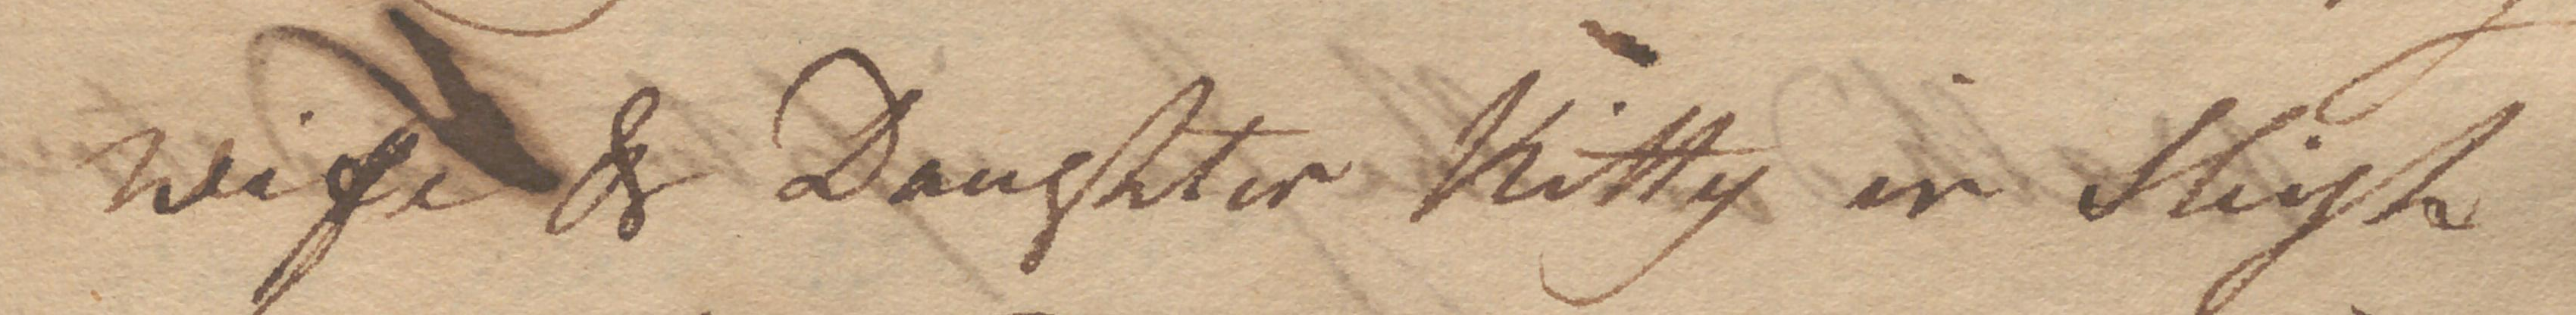wife & Daughter Kitty in Sleigh
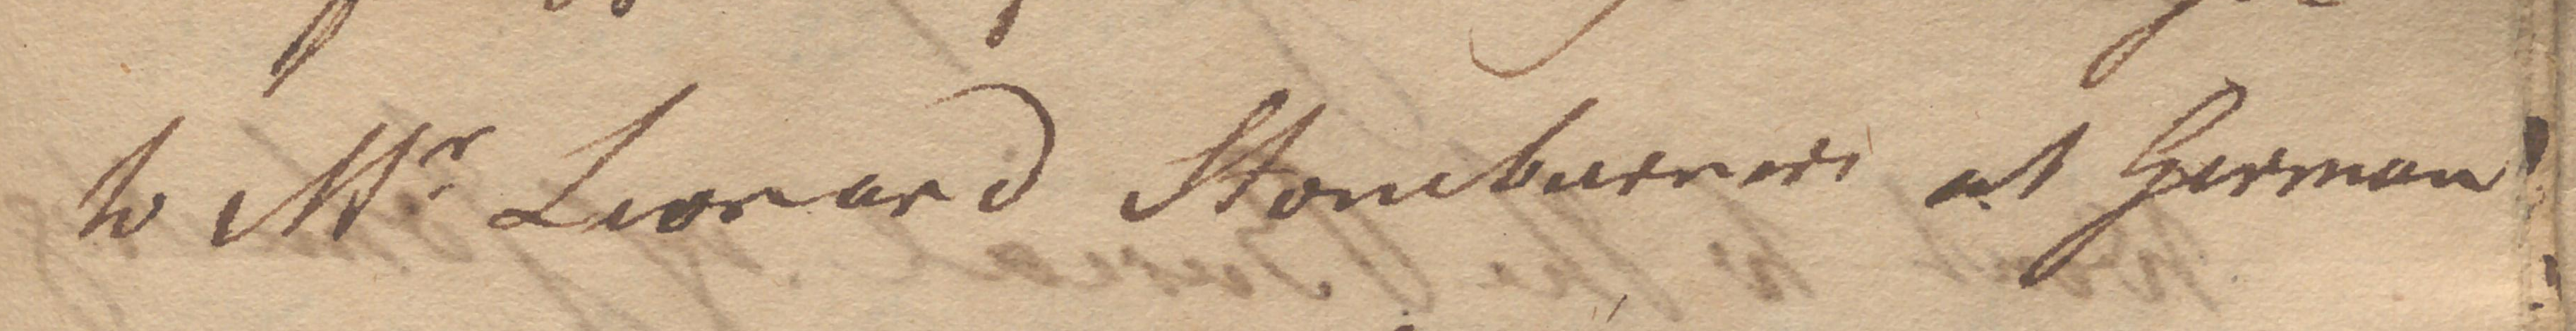to M^r. Leonard Stoneburners at German
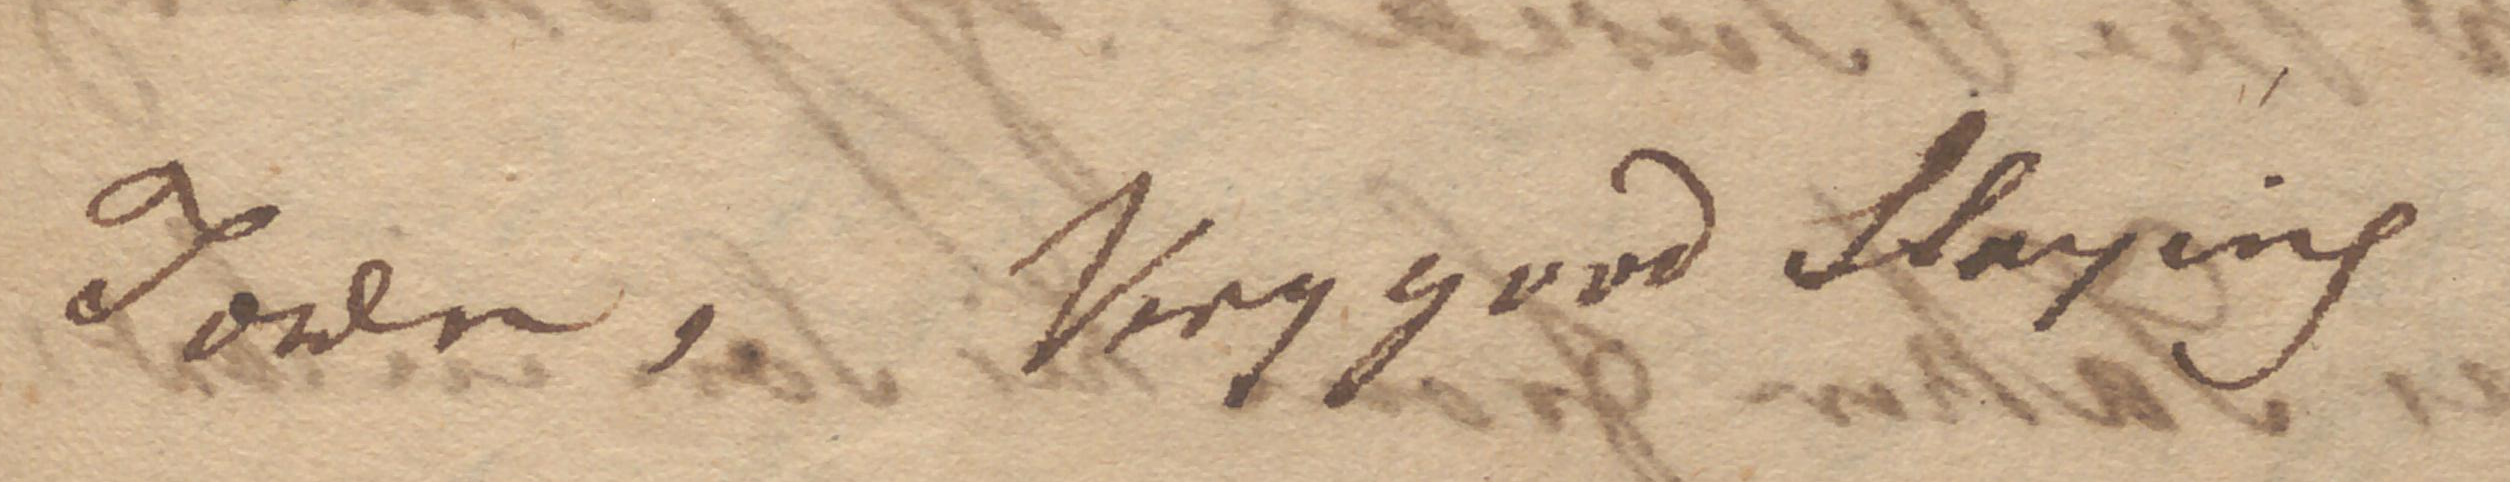Towns. Very good Slaying
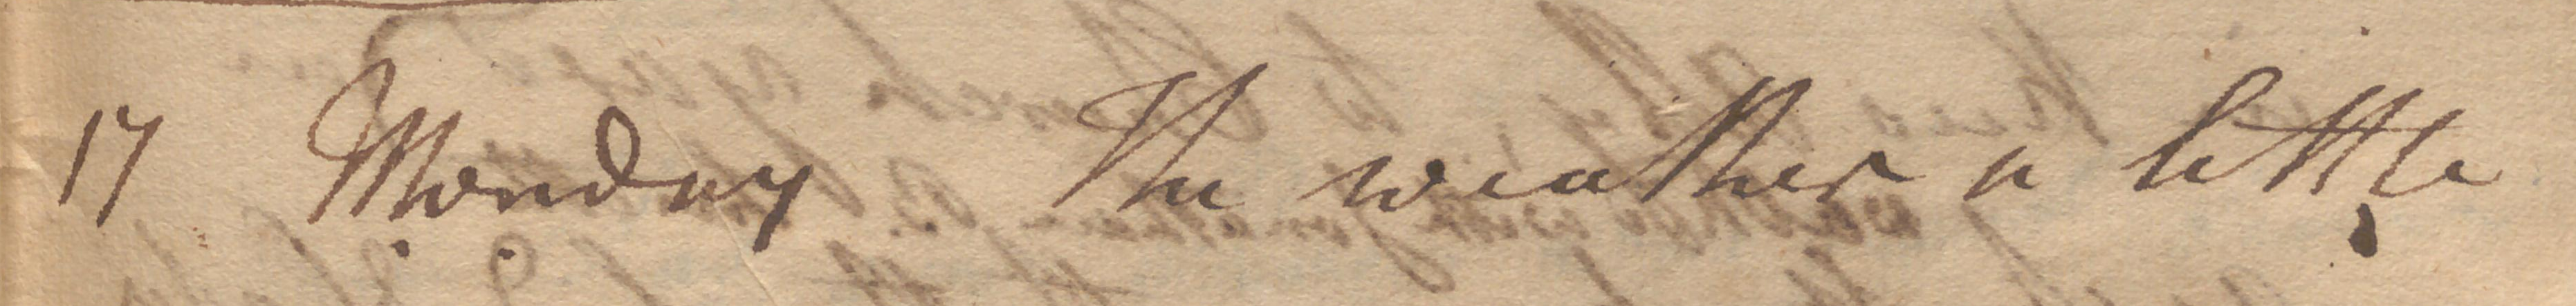17 Monday The weather a little
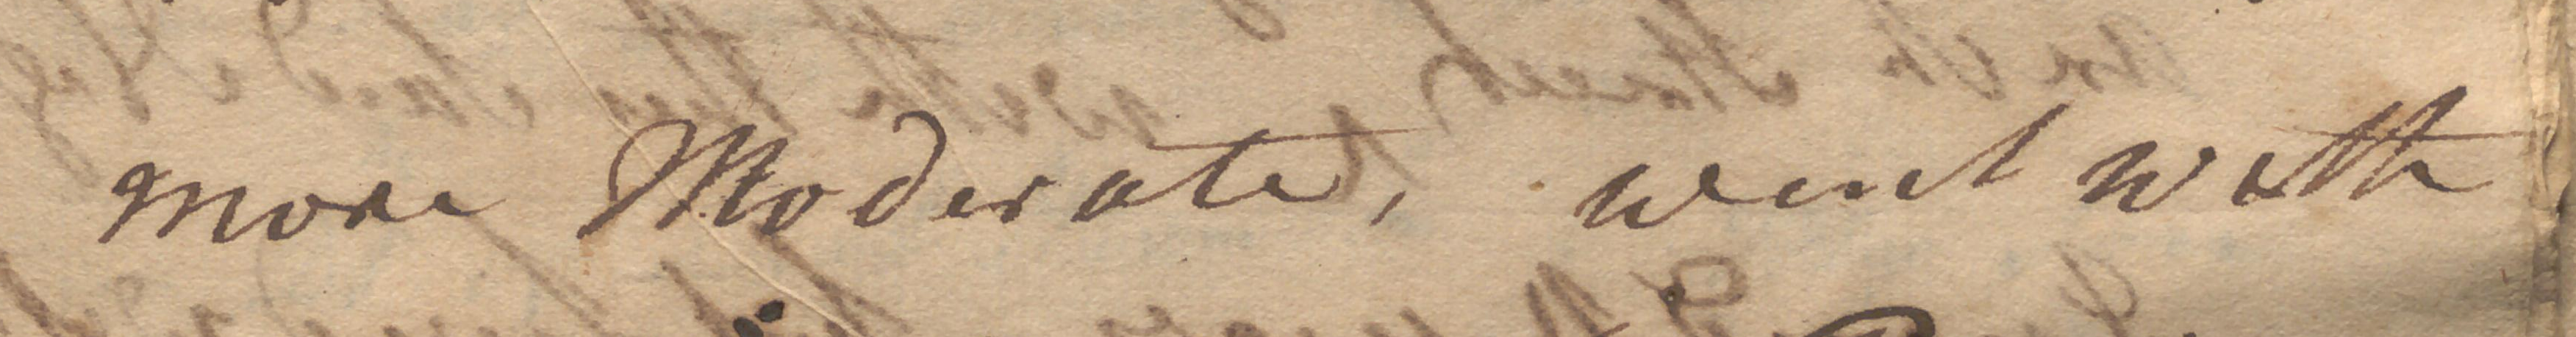more Moderate, went with
